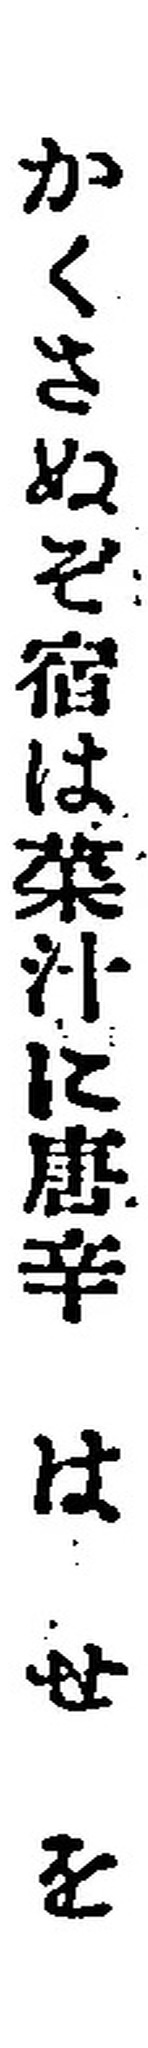かくさぬぞ宿は菜汁に唐辛はせを
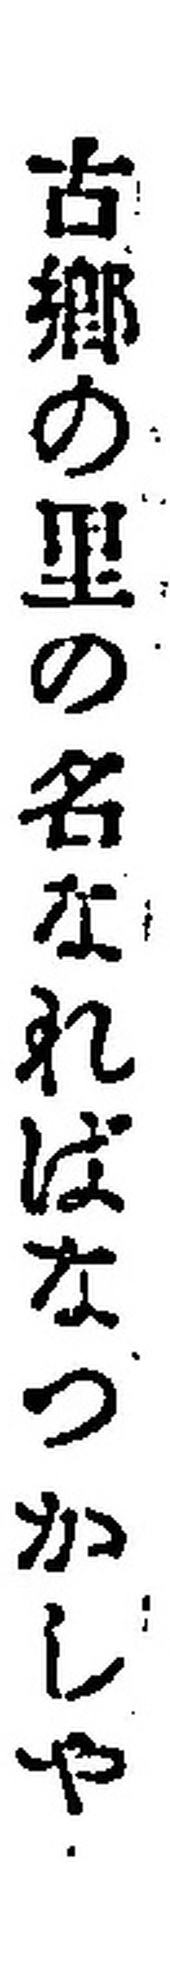古郷の里の名なればなつかしや
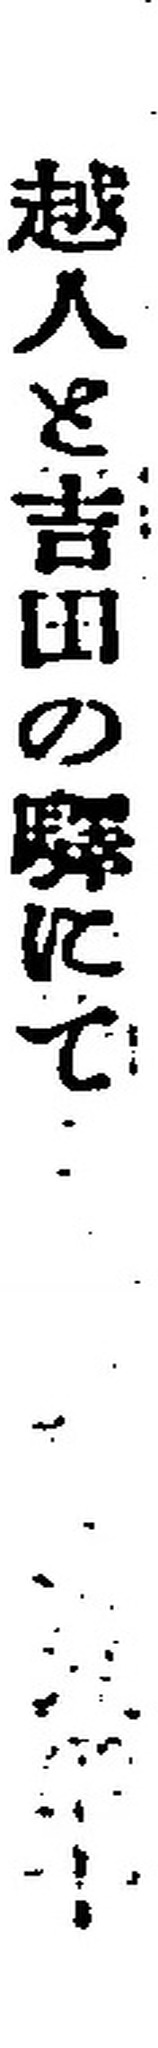越人と吉田の駅にて
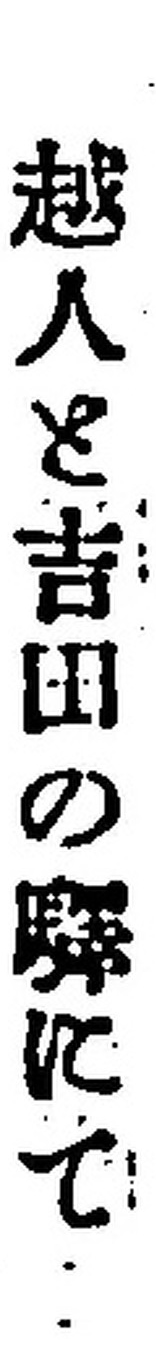越人と吉田の駅にて
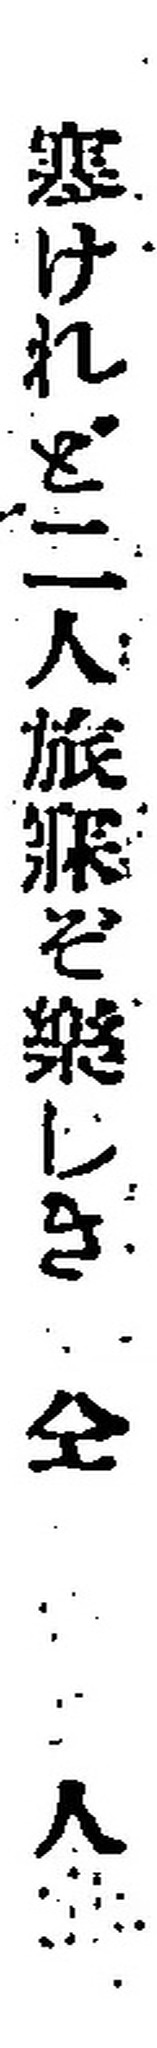寒けれど二人旅寐ぞ楽しき仝人
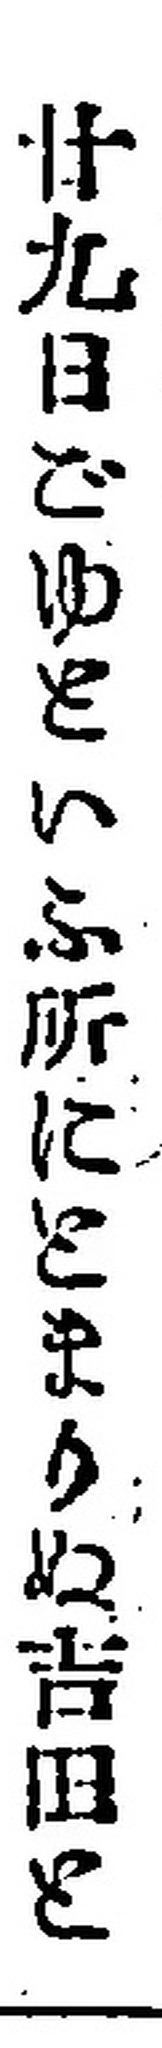廿九日ごゆといふ所にとまりぬ吉田と
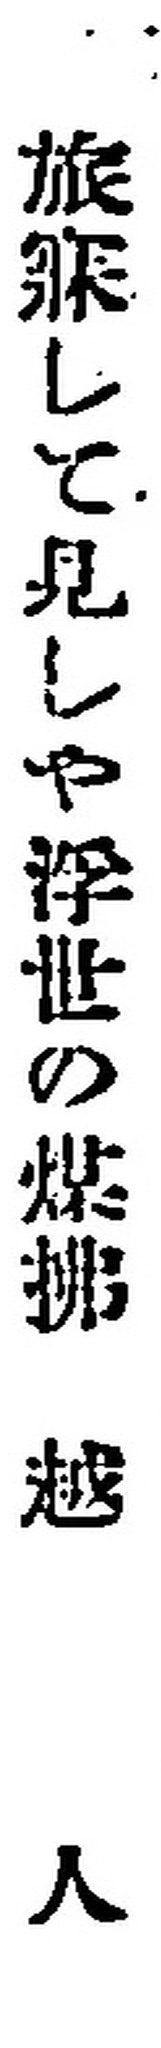旅寐して見しや浮世の煤払越人
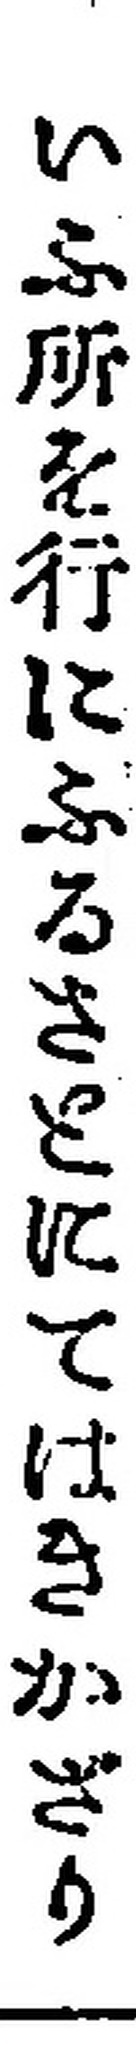いふ所を行にふるさとにてはきかざり
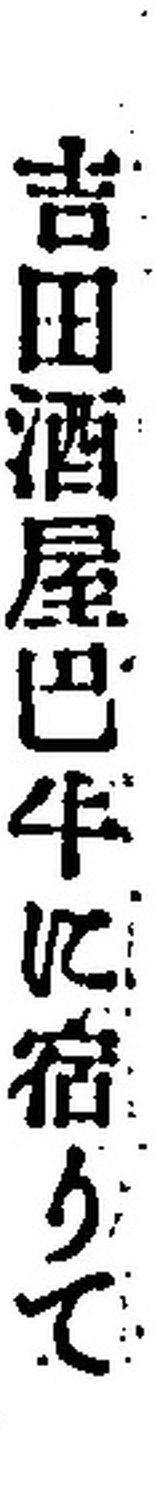吉田酒屋巴牛に宿りて
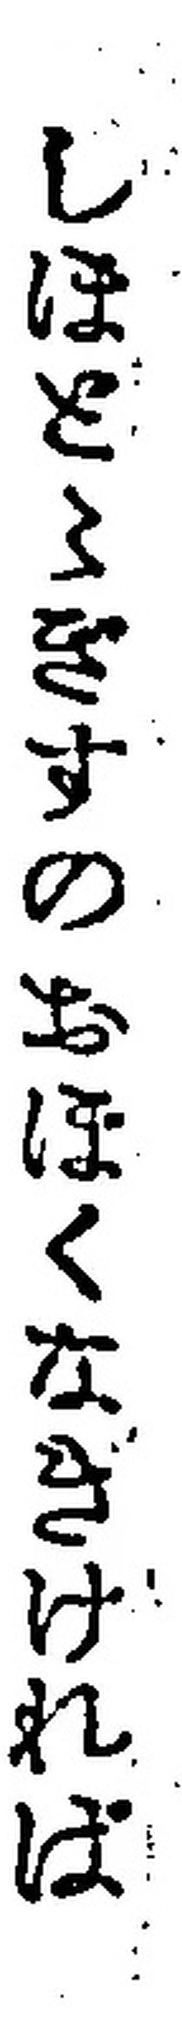しほとゝぎすのおほくなきければ
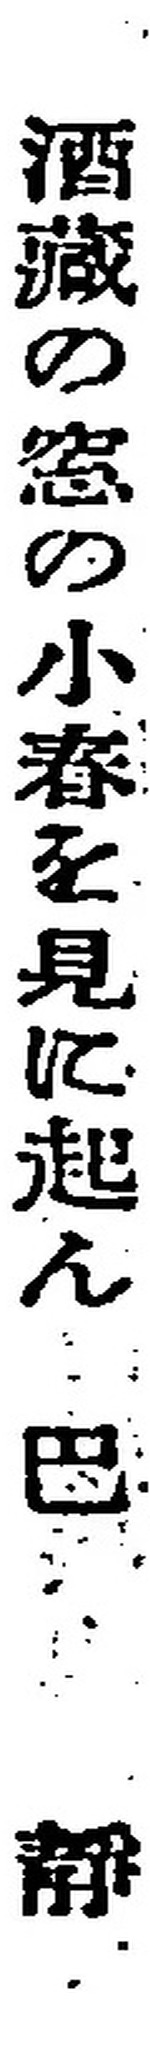酒蔵の窓の小春を見に起ん巴静
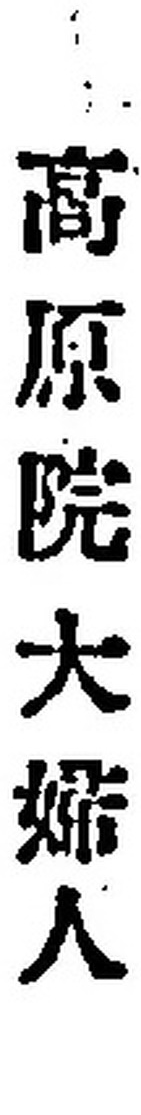高原院大婦人
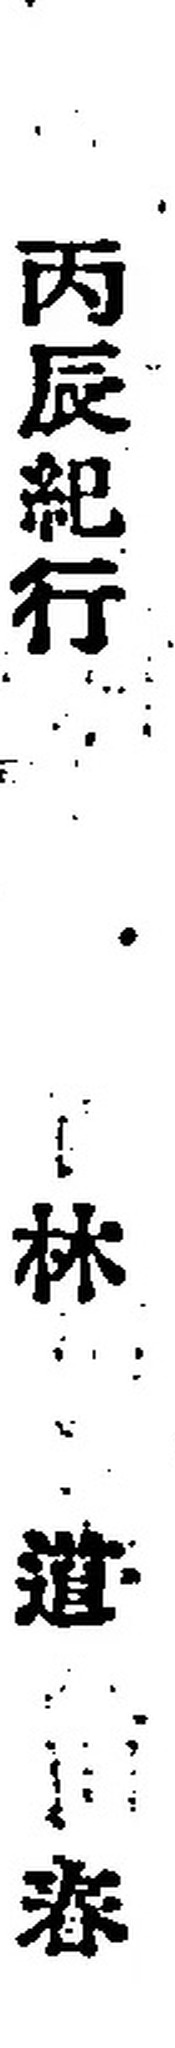丙辰紀行林道春

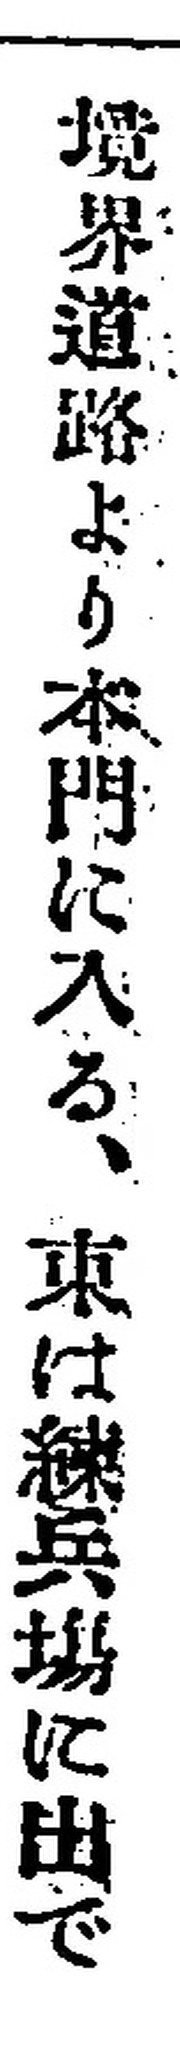境界道路より本門に入る、東は練兵場に出で
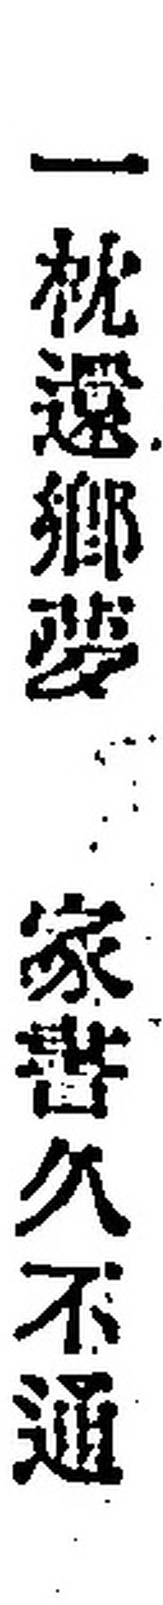一枕還郷夢家書久不通
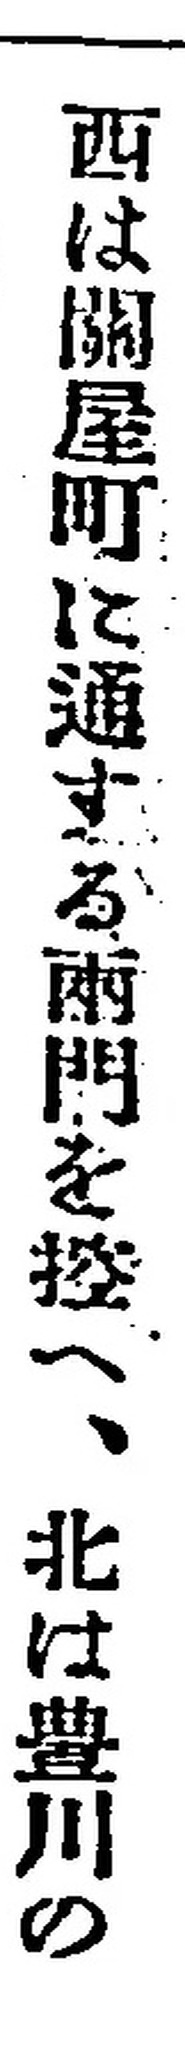西は関屋町に通する両門を控へ、北は豊川の
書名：東参名勝案内
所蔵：国立国会図書館 National Diet Library, JAPAN
